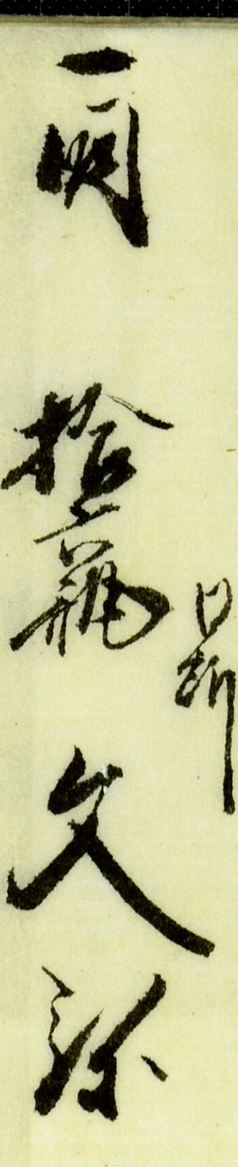一同拾六瓶文弥
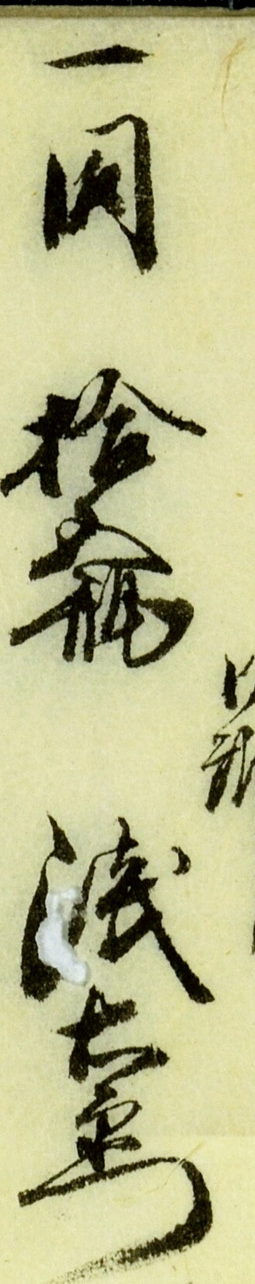一同拾五瓶浅右衛門
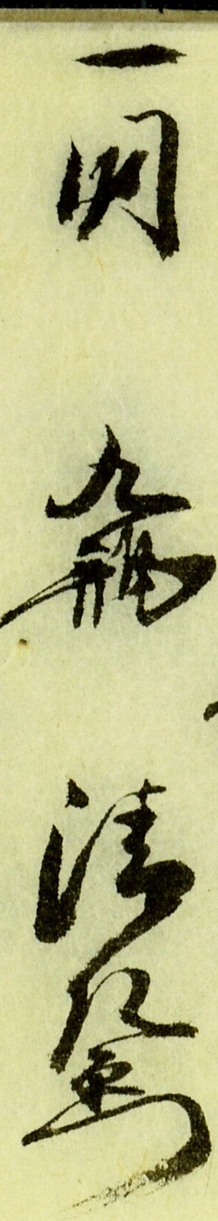一同九瓶清左衛門
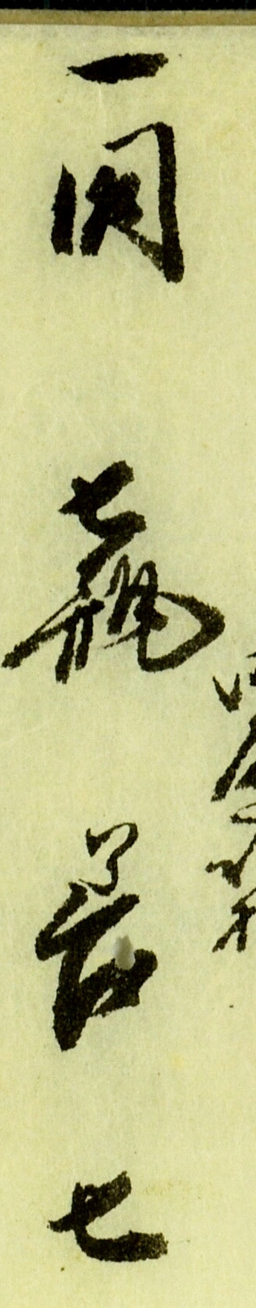一同七瓶善七
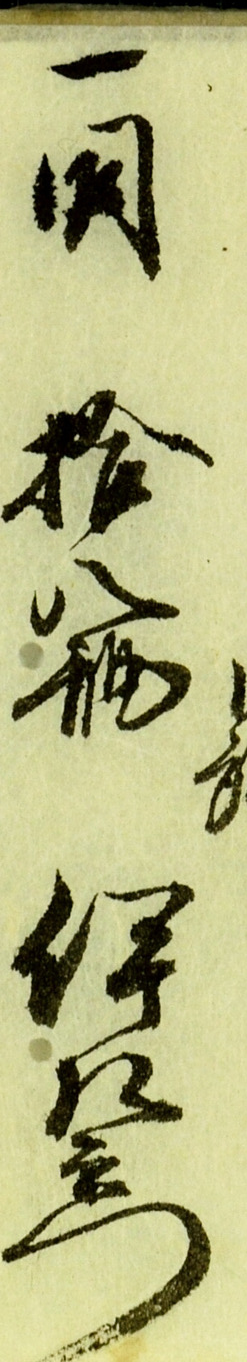一同拾八瓶伊左衛門
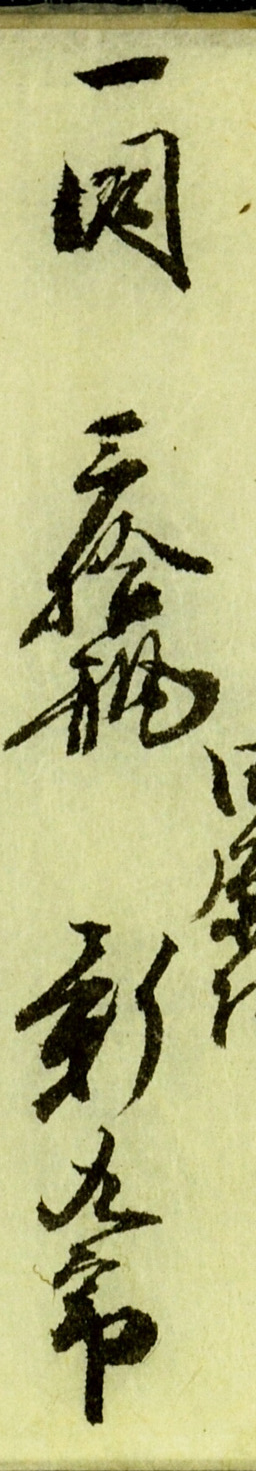一同三拾瓶新九郎
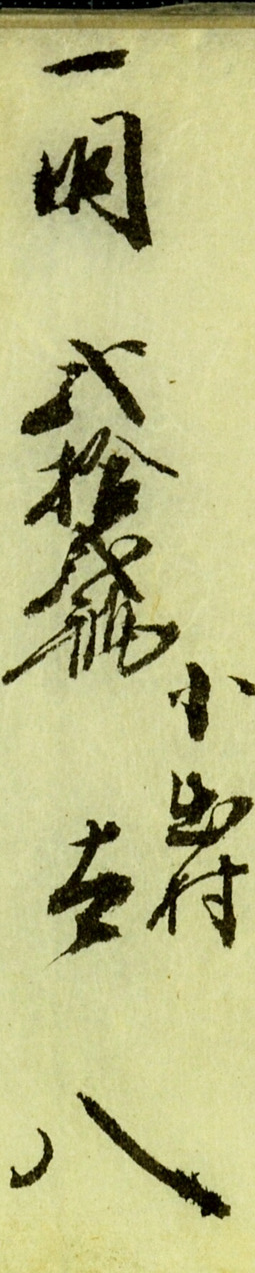一同弐拾弐瓶太八
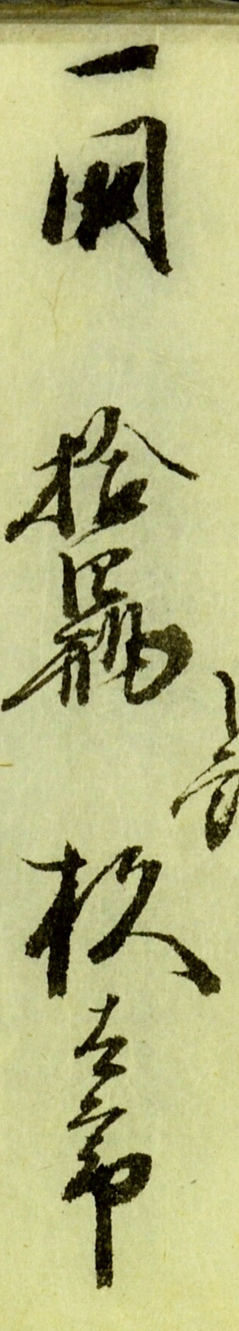一同拾四瓶杉太郎

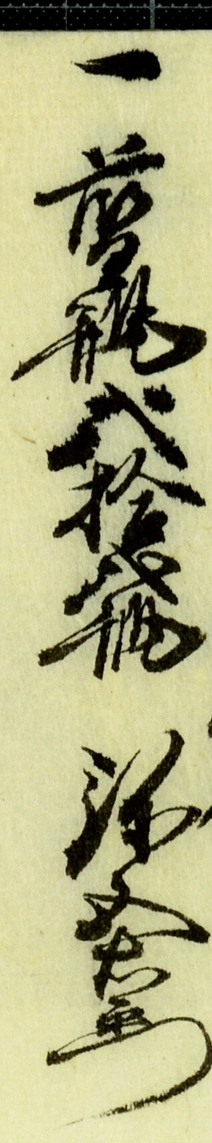一藍瓶弐拾弐瓶弥五右衛門
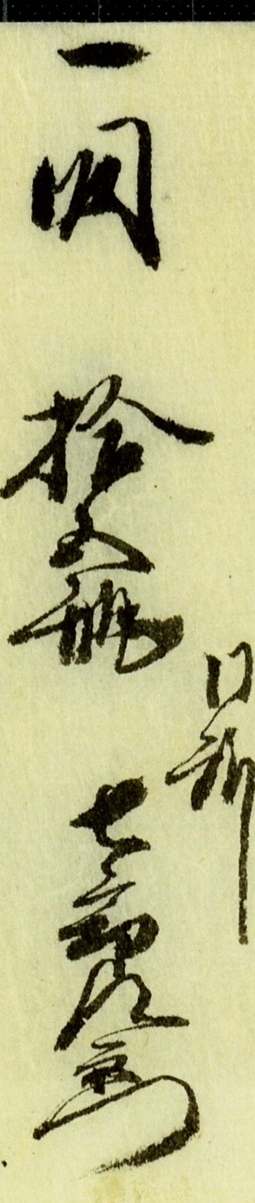一同拾五瓶七郎左衛門
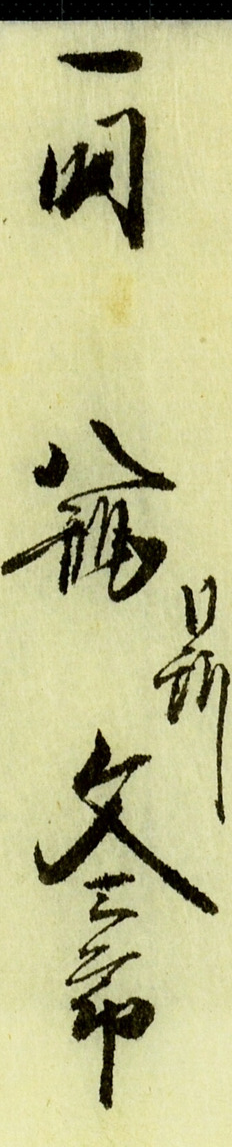一同八瓶文三郎
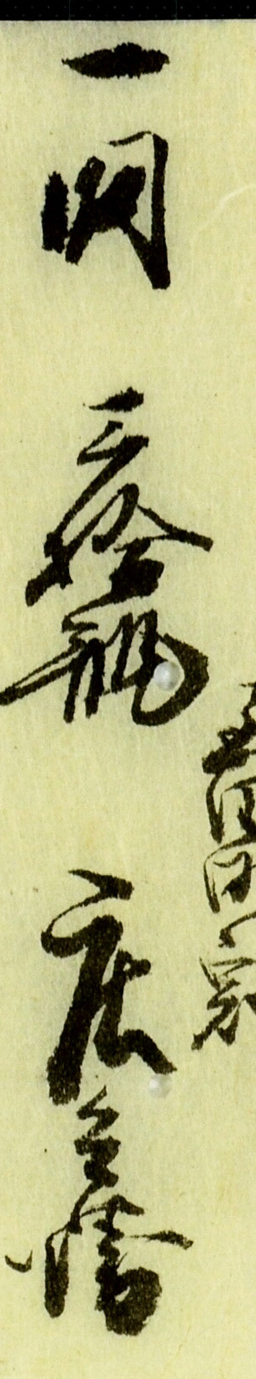一同三拾瓶庄兵衛
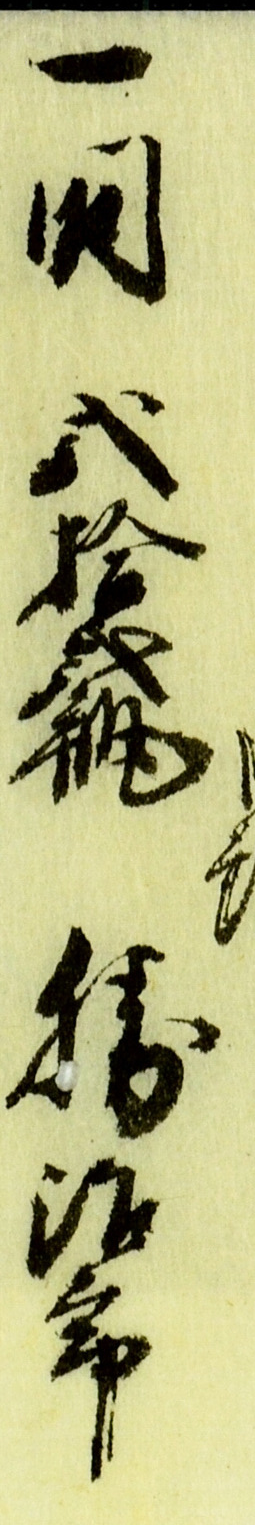一同弐拾弐瓶勝治郎
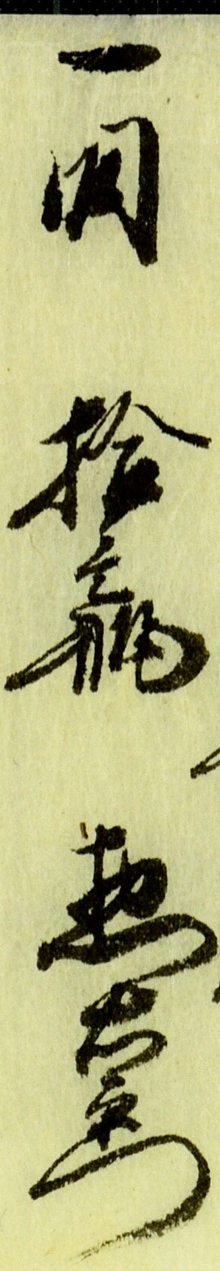一同拾壱瓶惣右衛門
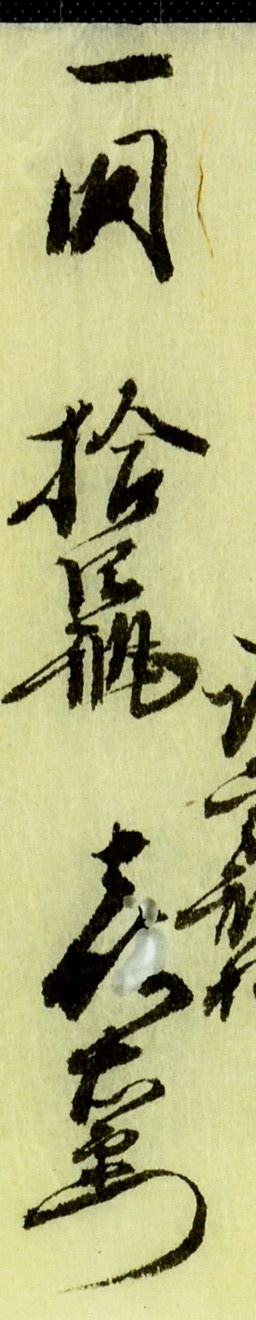一同拾五瓶七郎左衛門
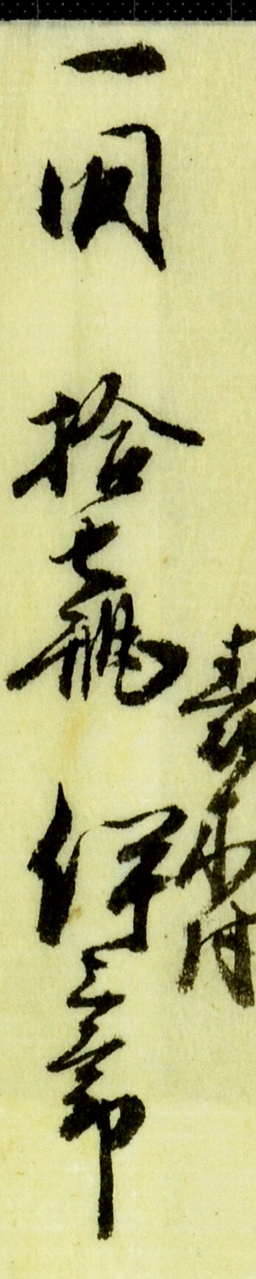一同拾七瓶伊三郎
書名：御領分中御領分中紺屋藍瓶員数御改帳
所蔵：伊那市立高遠町図書館・合同会社AMANE
